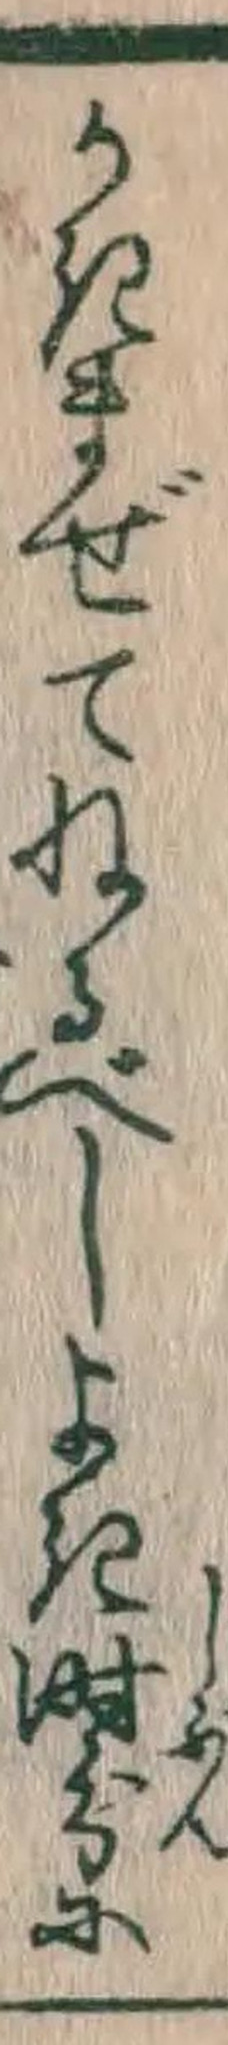かきまぜてねるべしよき時分に
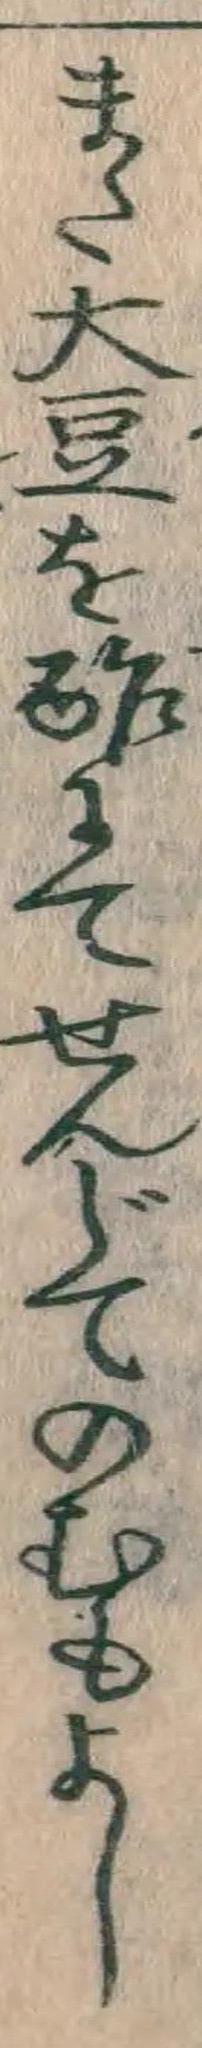また大豆を酢にてせんじてのむもよし
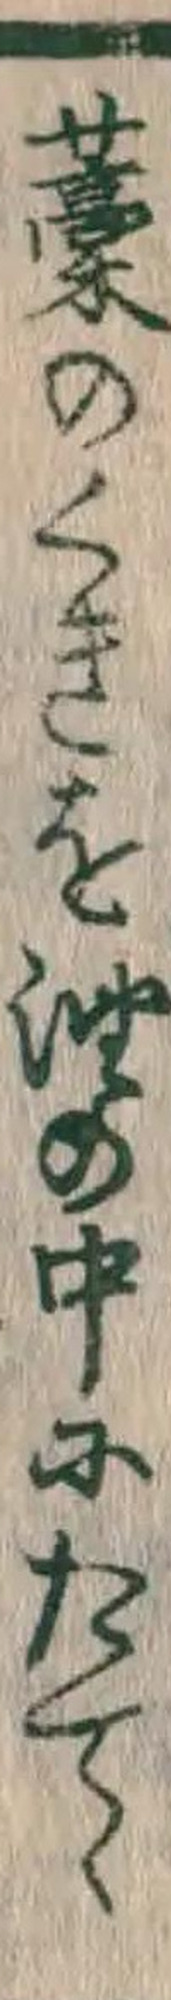藁のくきを油の中にたてゝ
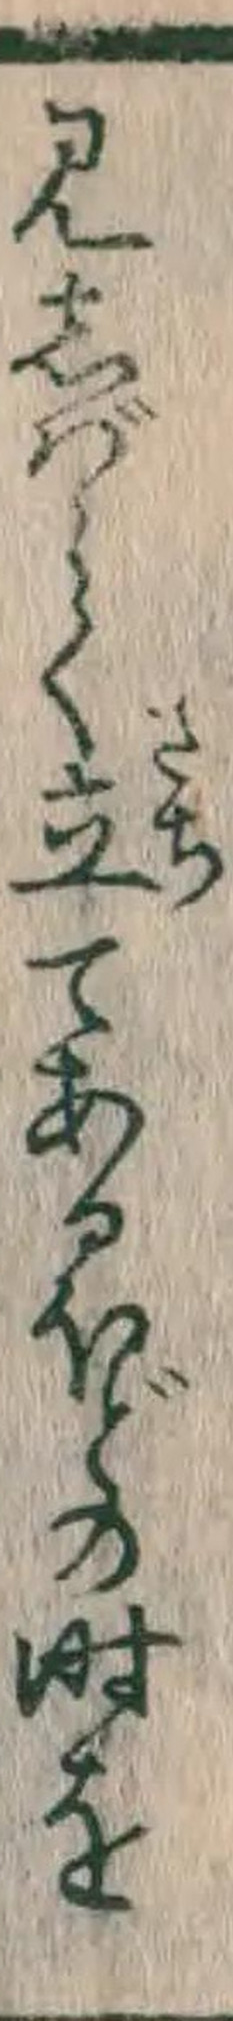見しばらく立てあるほどの時を
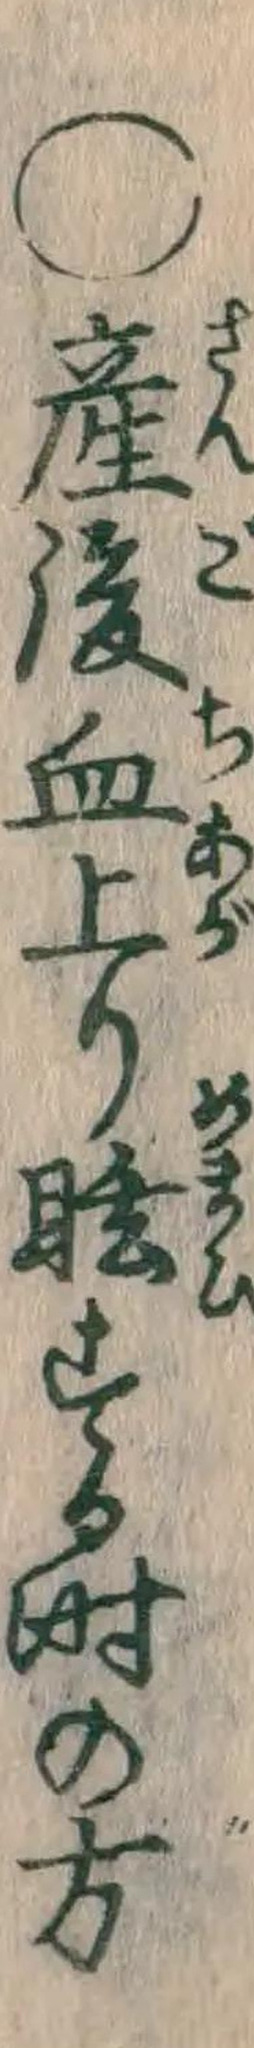○産後血上り眩する時の方
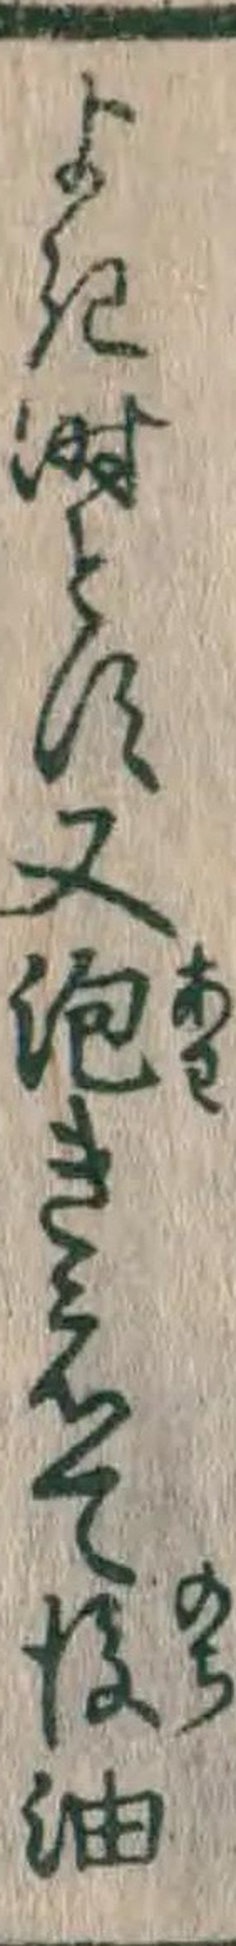よき時とす又泡きえて後油
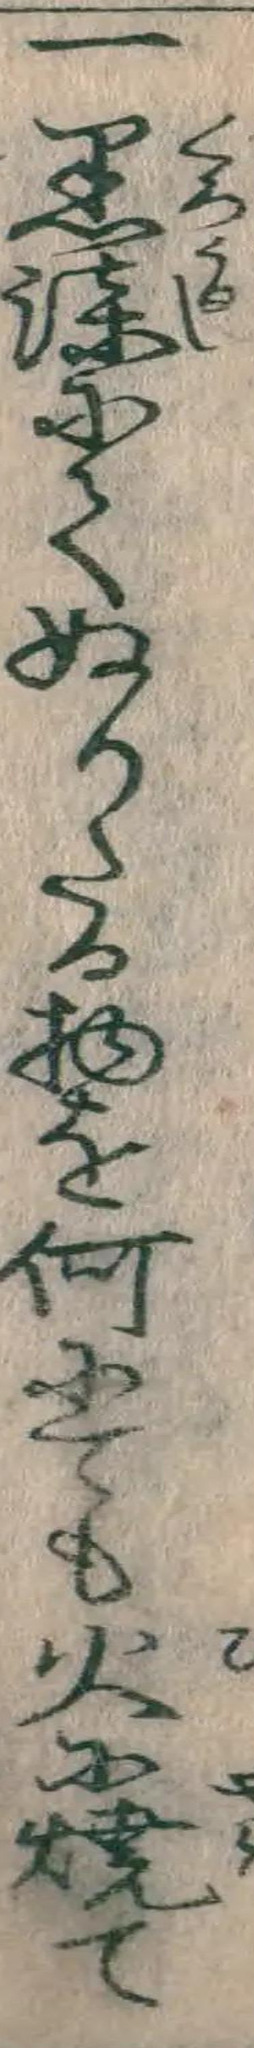一黒漆にてぬりたる物を何にても火に焼て
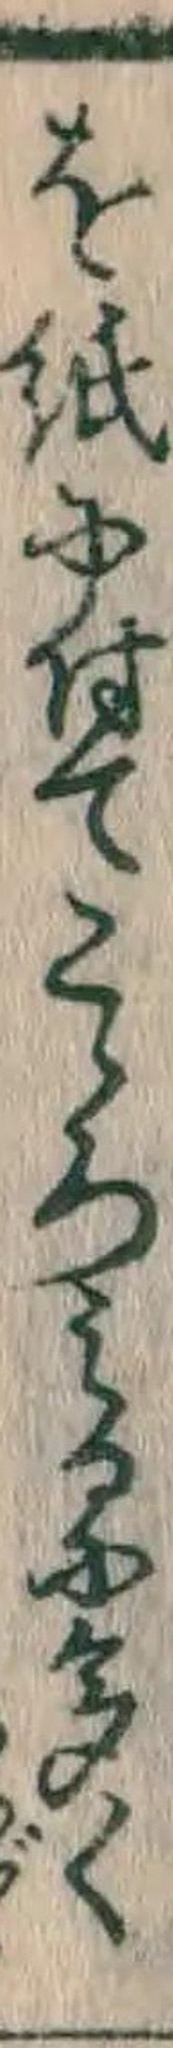を紙に付てこゝろみるに多く
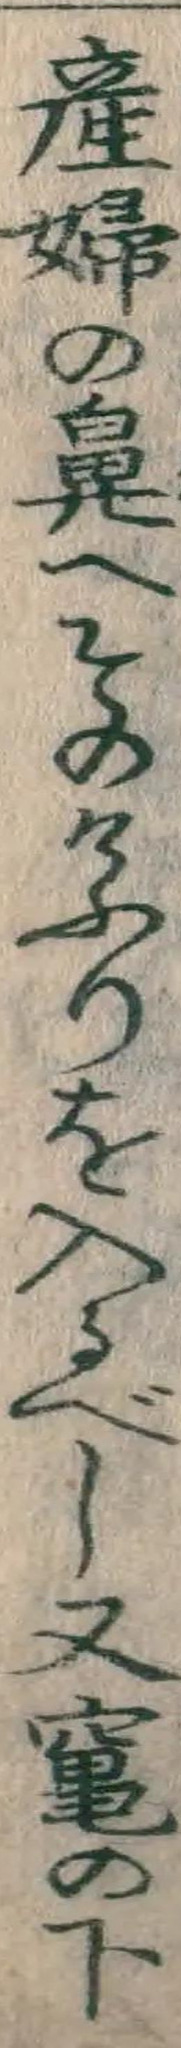産婦の鼻へそのけふりを入るべし又竈の下
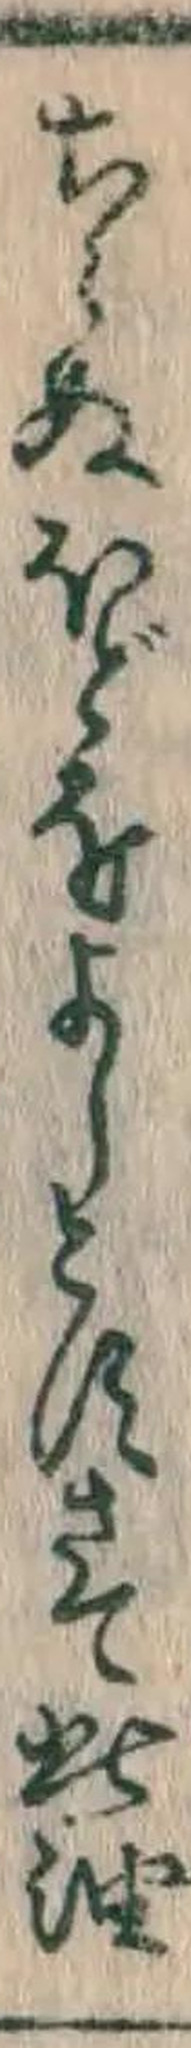ちらぬほどをよしとすさて此油
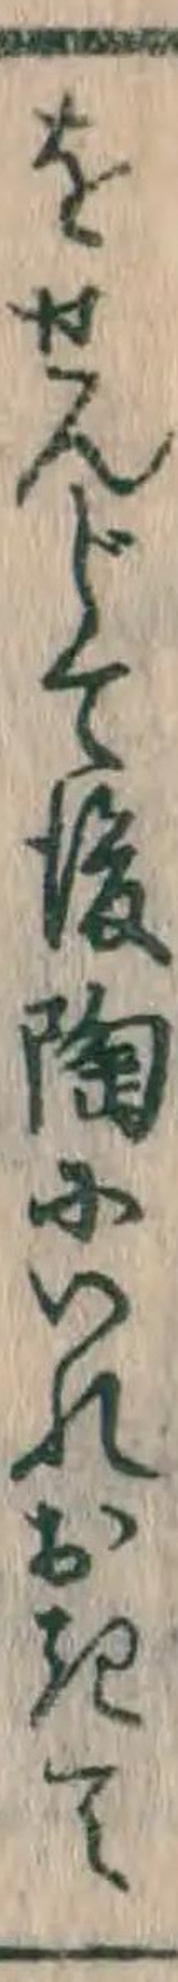をせんじて後陶にいれおきて
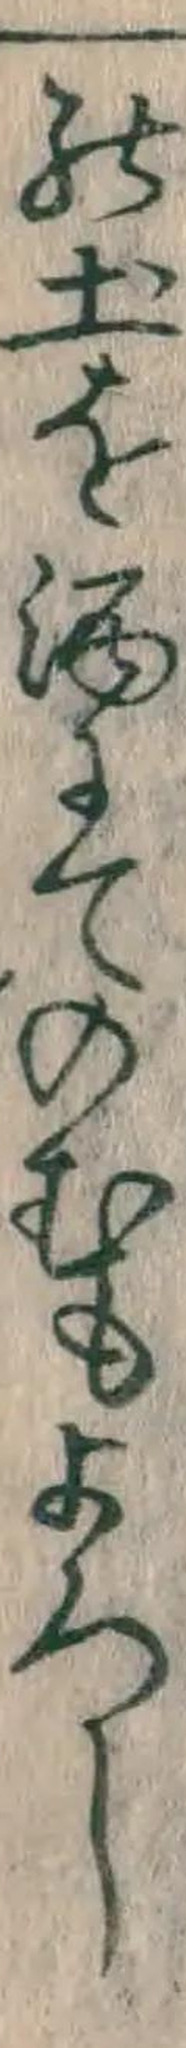の土を酒にてのむもよろし
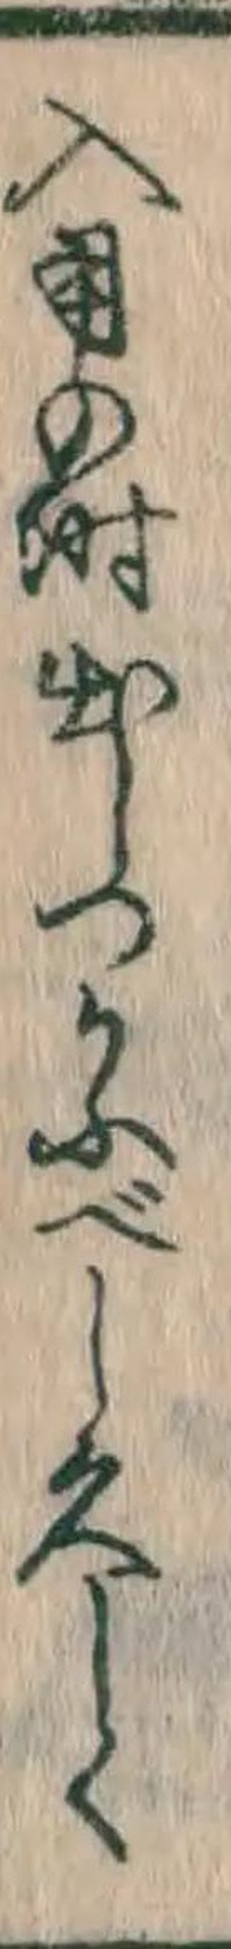入用の時出しつかふべし久しく
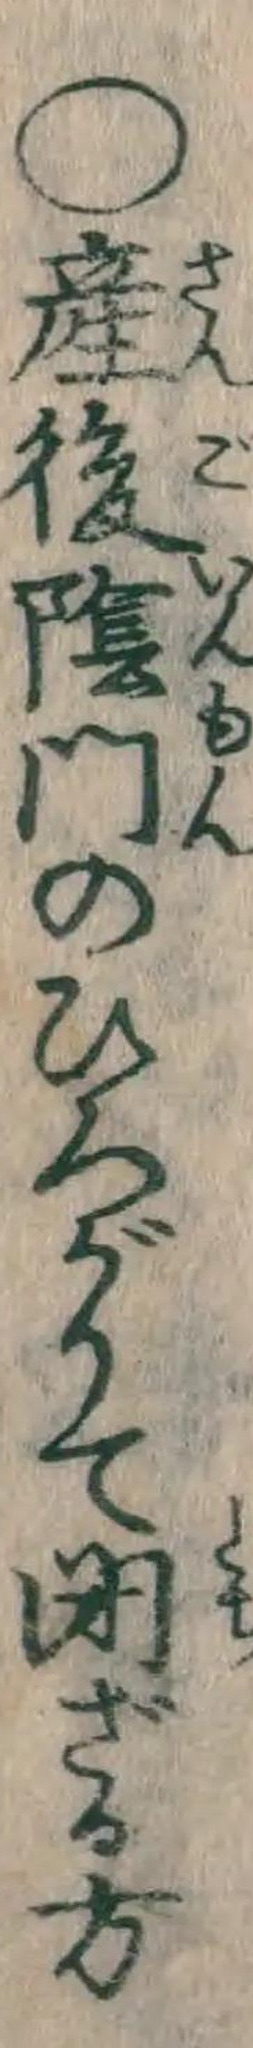○産後陰門のひろがりて閉ざる方

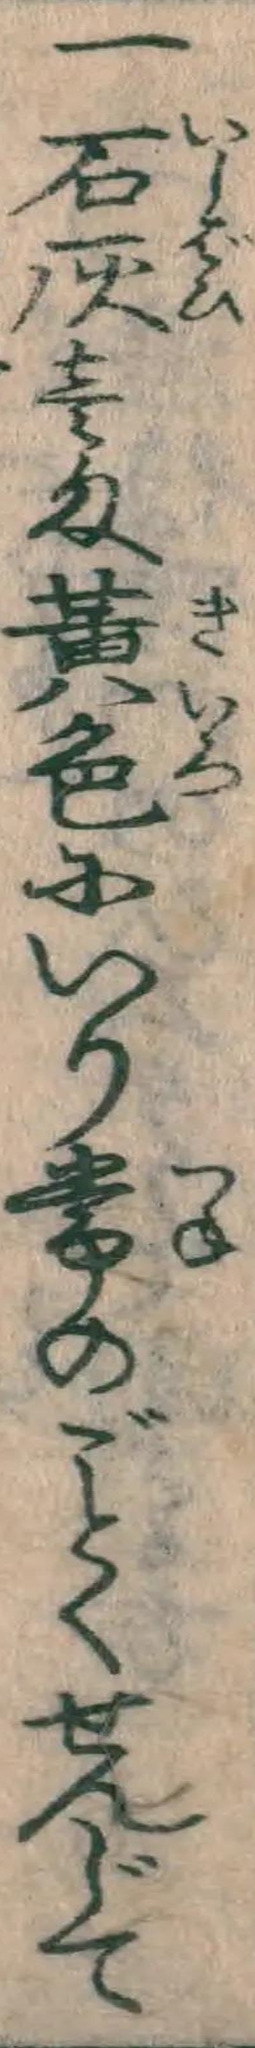一石灰壱匁黄色にいり常のごとくせんじて
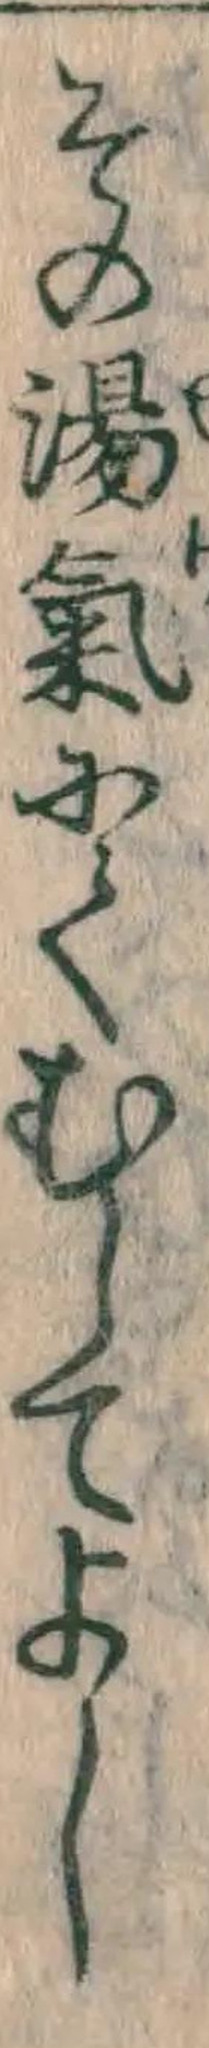その湯気にてむしてよし
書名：広益秘事大全 3巻. [3]
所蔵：国立国会図書館 National Diet Library, JAPAN
